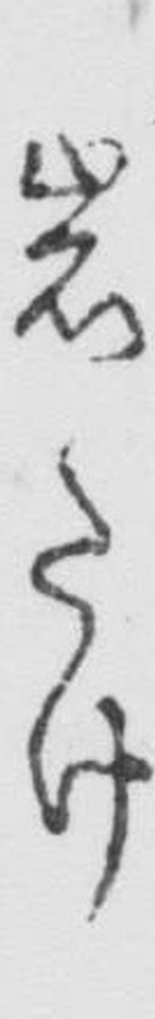岩たけ
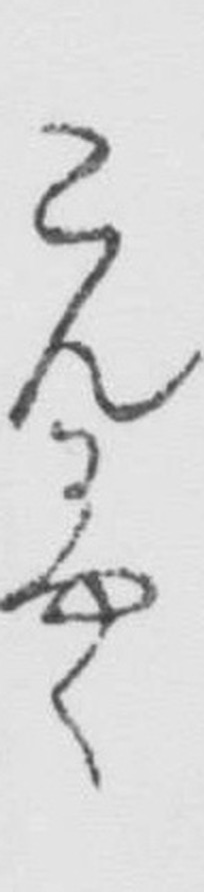こんにやく
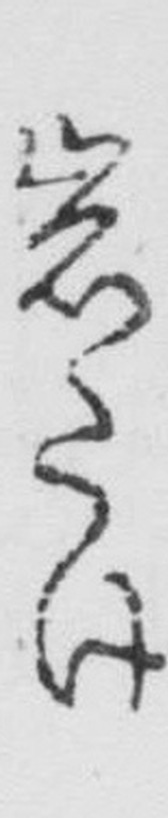岩たけ
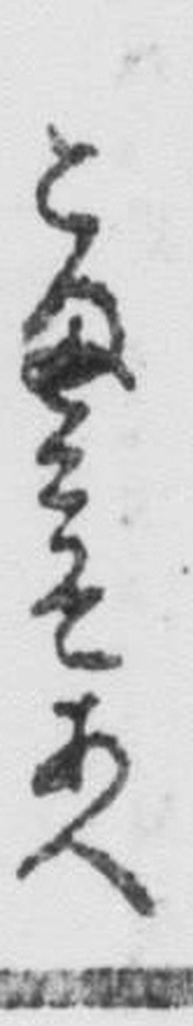こまみそあへ
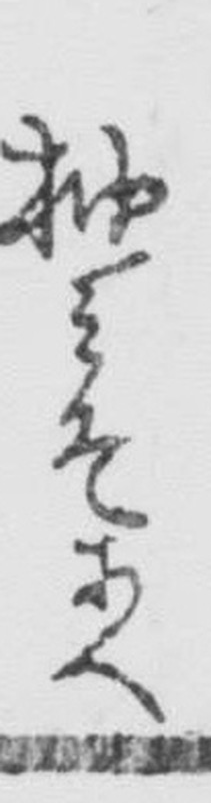柚みそあへ
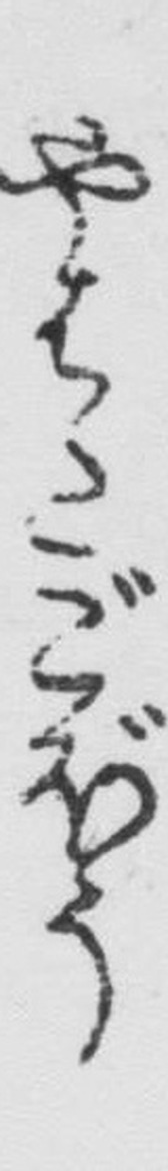やはたごぼう
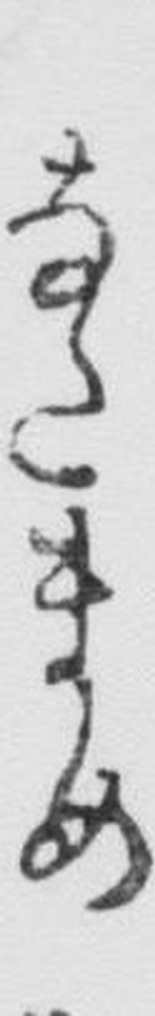なたまめ
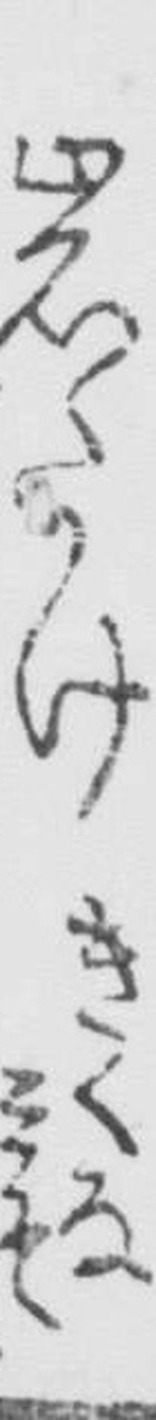岩たけきくな
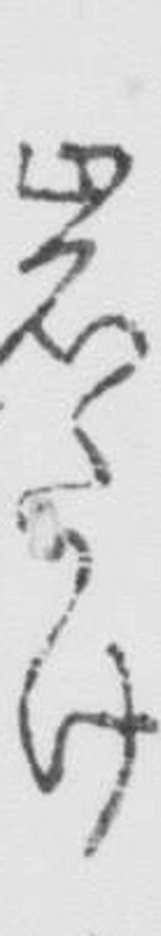岩たけ
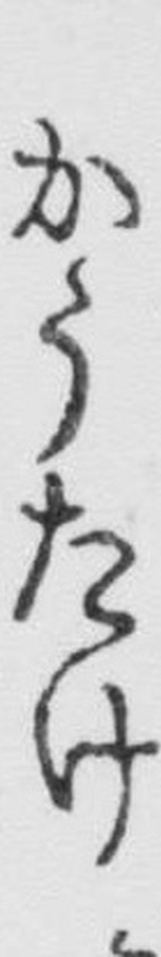かうたけ
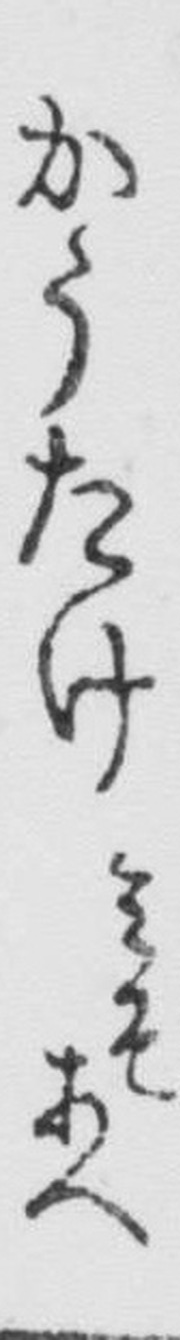岩たけみそあへ
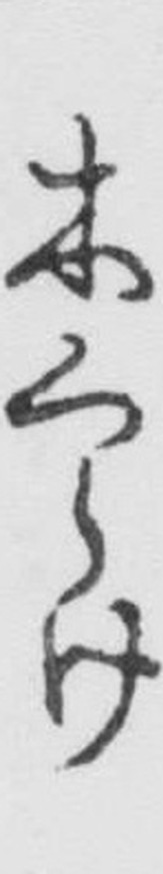木くらけ
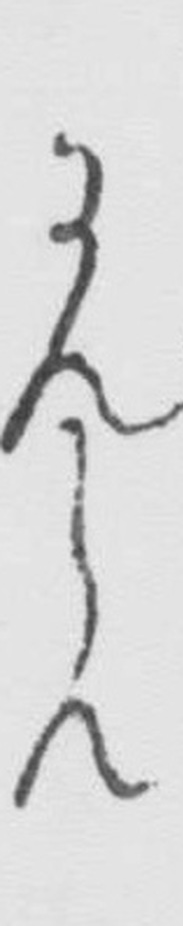にんしん
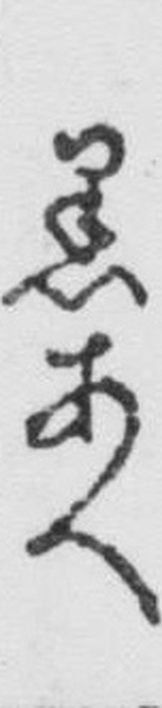黒あへ
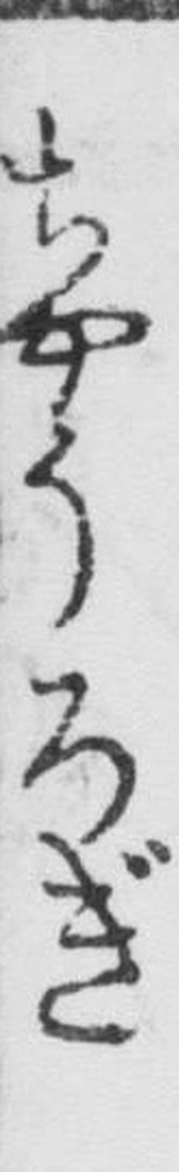ちやうろぎ

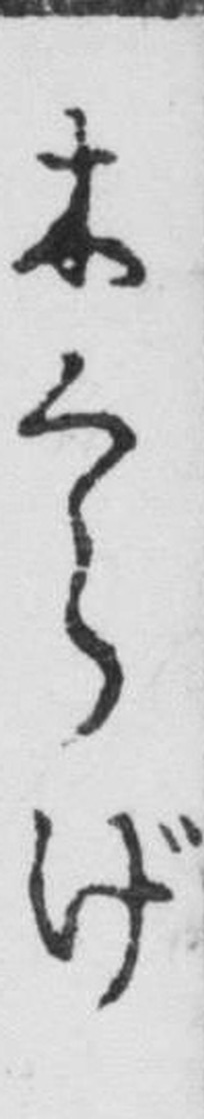木くらげ
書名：諸家通用/即席料理
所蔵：大阪府立大学学術情報センター 国文学研究資料館
